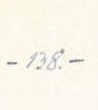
138
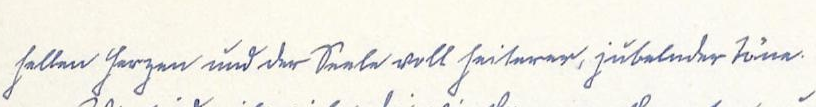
hellen Herzen und der Seele voll heiterer, jubelnder Töne.
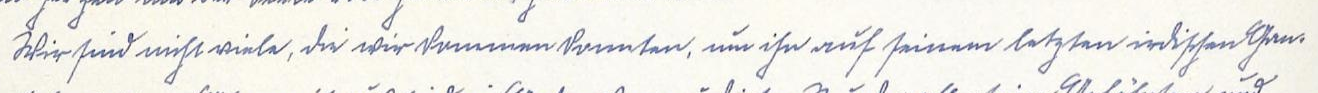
Wir sind nicht viele, die wir kommen konnten, um ihn auf seinem letzten irdischen Gang
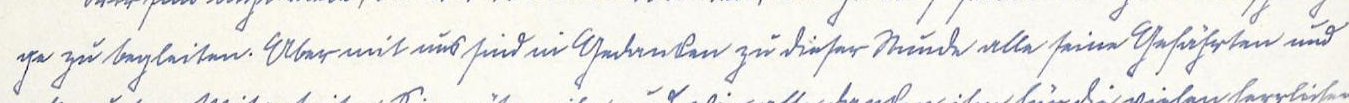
ge zu begleiten. Aber mit uns sind in Gedanken zu dieser Stunde alle seine Gefährten und
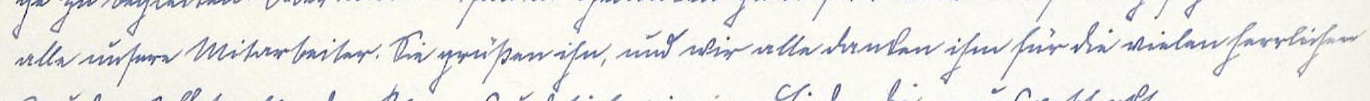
alle unsere Mitarbeiter. Sie grüßen ihn, und wir alle danken ihm für die vielen herrlichen
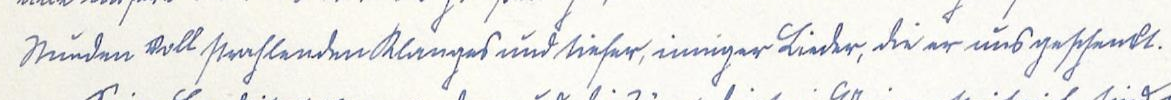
Stunden voll strahlenden Klanges und tiefer, inniger Lieber, die er uns geschenkt.
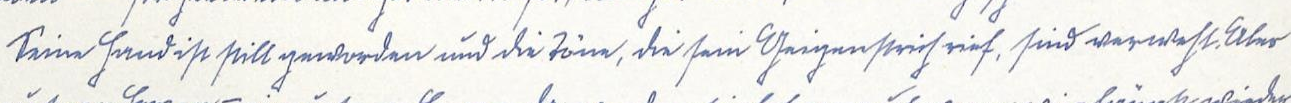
Seine Hand ist still geworden und die Töne, die sein Geigenstrich rief, sind verweht. Aber
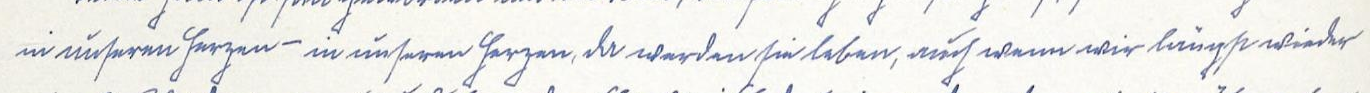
in unseren Herzen -in unseren Herzen, da werden sie leben, auch wenn wir längst wieder
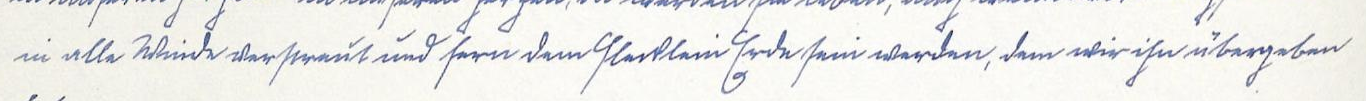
in alle Wider verstreut und fern dem Flecklein Erde sein werden, dem wir ihn übergeben
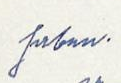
haben.
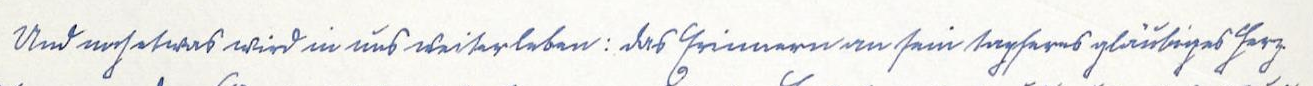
Und noch etwas wird in uns weiterleben: Das Erinnern an sein tapferes gläubiges Herz.
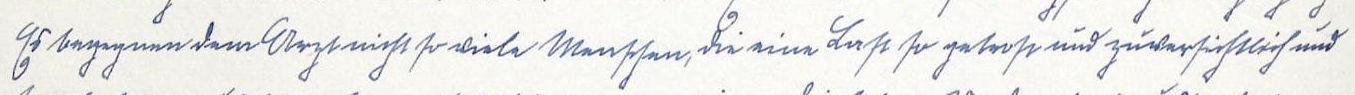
Es begegnen dem Arzt nicht so viele Menschen, die eine Last so getrost und zuversichtlich und
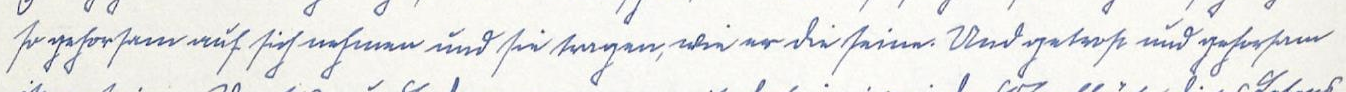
so gehorsem auf sich nehmen und sie tragen, wie er die seine. Und getrost und gehorsam
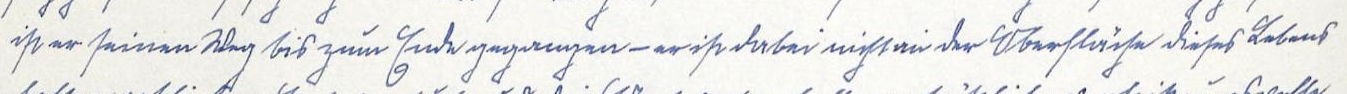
ist er seinen Weg bis zum Ende gegangen- er ist dabei nicht an der Oberfläche dieses Lebens
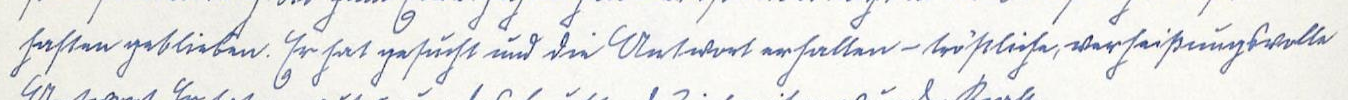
haften geblieben. Er hat gesucht und die Antwort erhalten.- tröstliche, verheißungsvolle
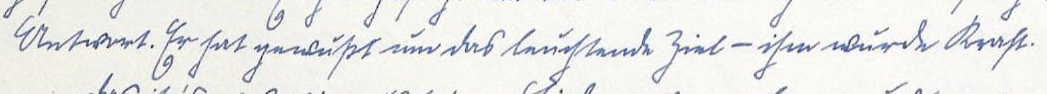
Antwort. Er hat gewußt um das leuchtende Ziel- ihm wurde Kraft.
